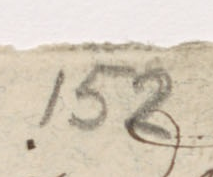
137.
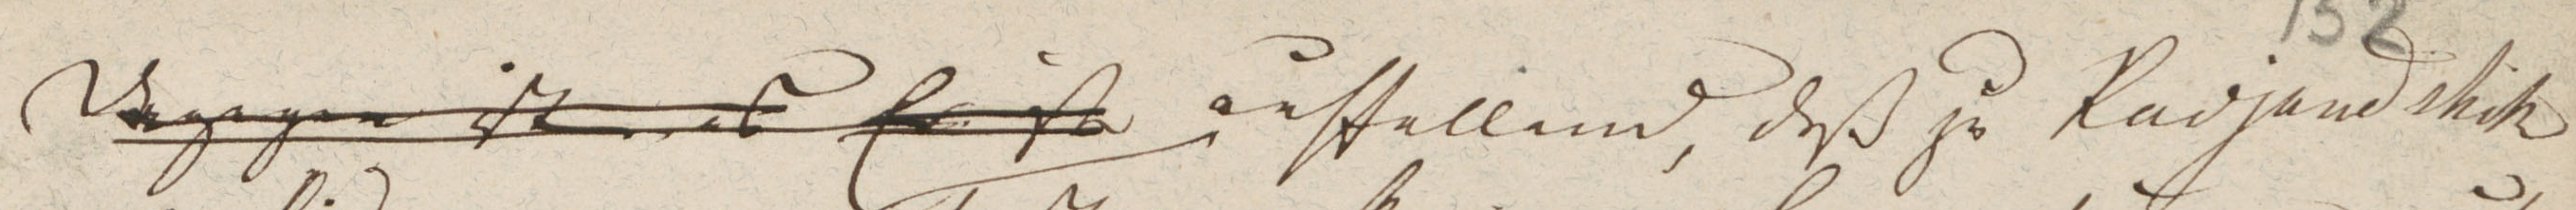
Dagegen ist es Es ist % auffallend, dass zu Kudjundshik
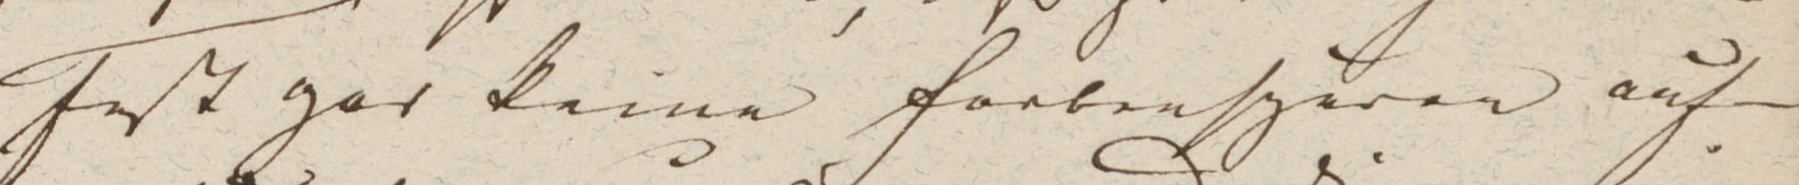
fast gar keine Farbenspuren auf-
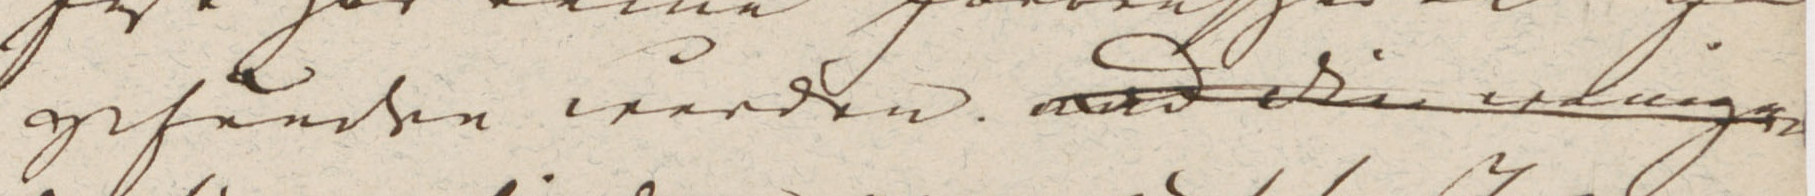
gefunden wurden. und die wenigen
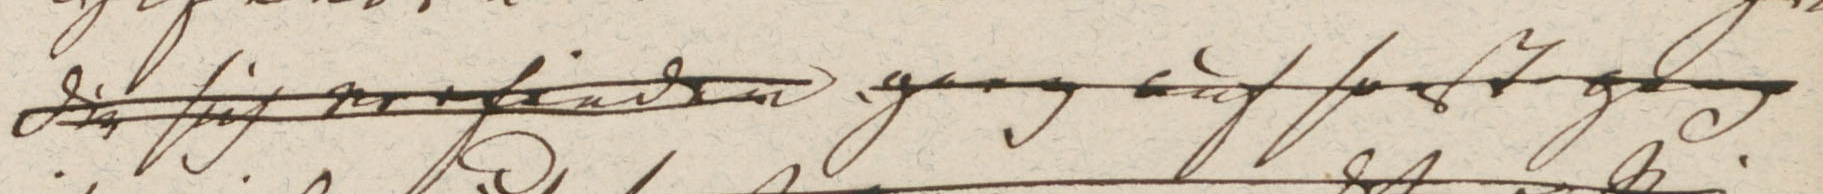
die sich vorfinden ganz auf sonst ganz
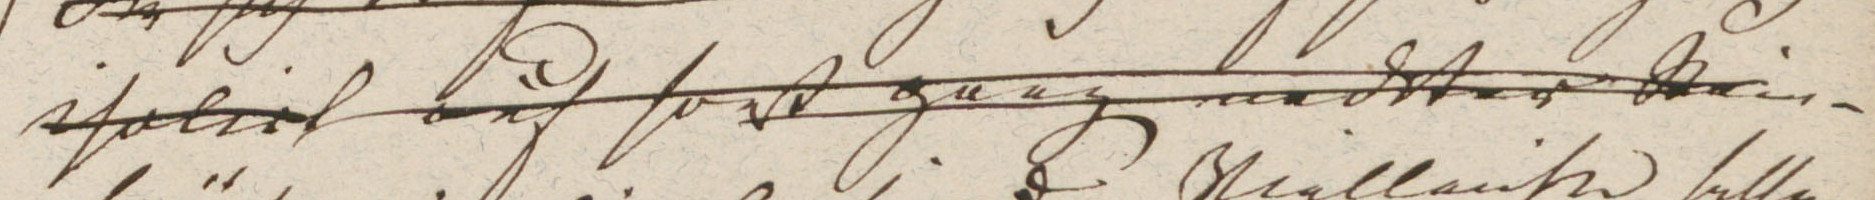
isolirt auf sonst ganz nackter Stein-
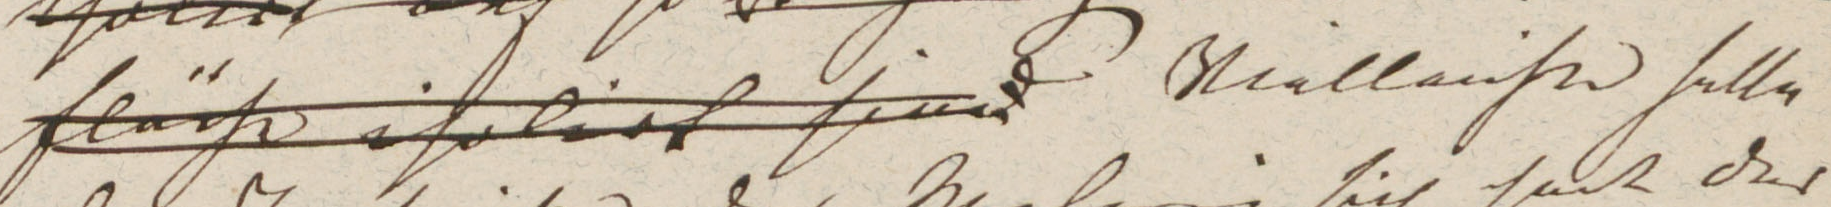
fläche isolirt sind Vielleicht hatte
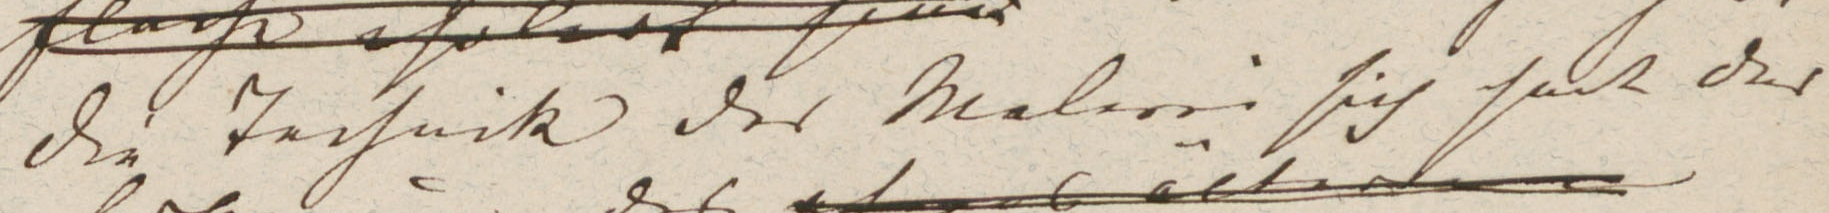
die Technik der Malerei sich seit der
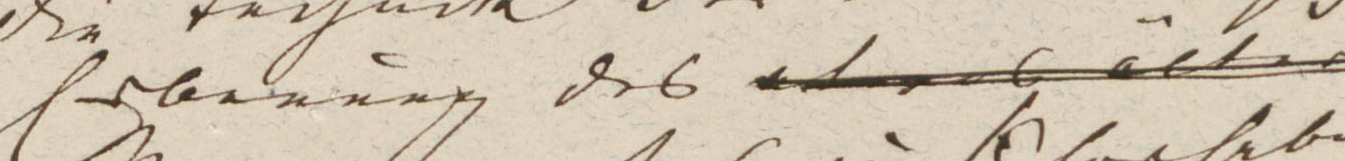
Erbauung des etwas älteren
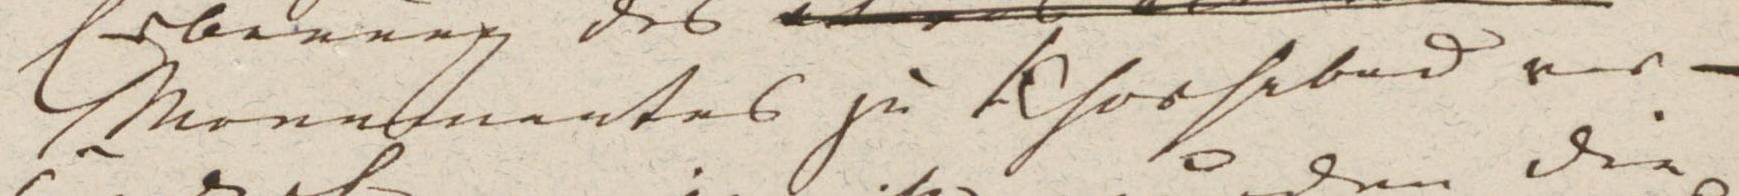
Monumentes zu Khorsabad ver-
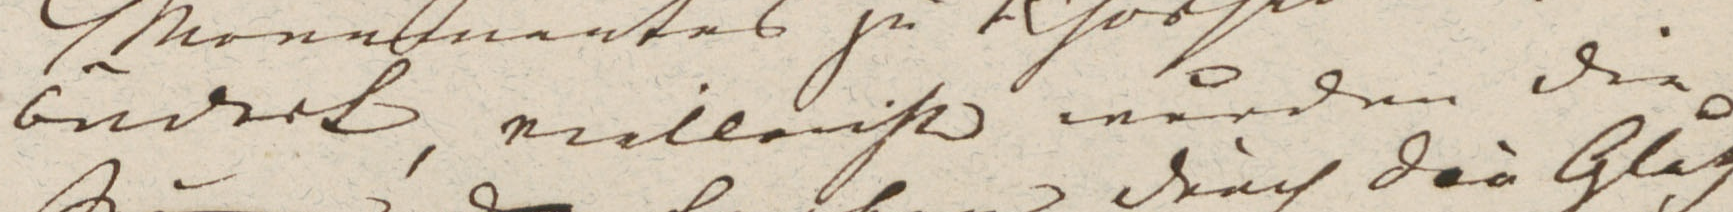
ändert, vielleicht wurden die
